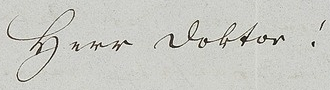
Herr Doktor!
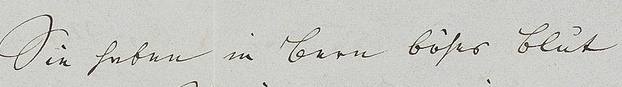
Sie haben in Bern böses Blut
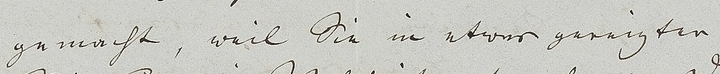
gemacht, weil Sie in etwas gereizter
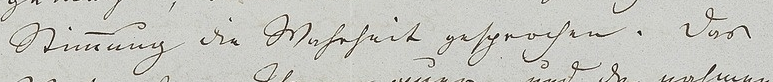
Stimmung die Wahrheit gesprochen. Das
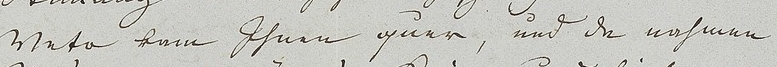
Veto kam Ihnen quer, und da nahmen
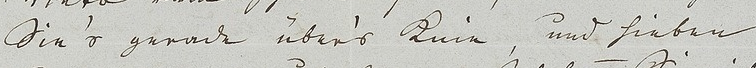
Sie's gerade über's Knie, und hieben
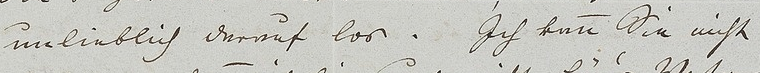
unlieblich darauf los. Ich kann Sie nicht
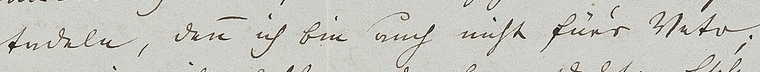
tadeln, denn ich bin auch nicht für's Veto;
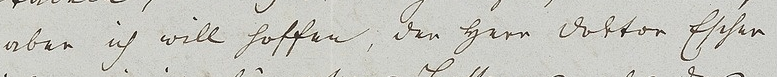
aber ich will hoffen, der Herr Doktor Escher
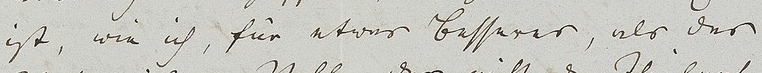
ist, wie ich, für etwas Besseres, als das
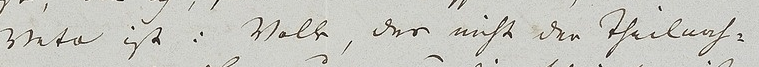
Veto ist: Volk, das nicht der Theilnah-
